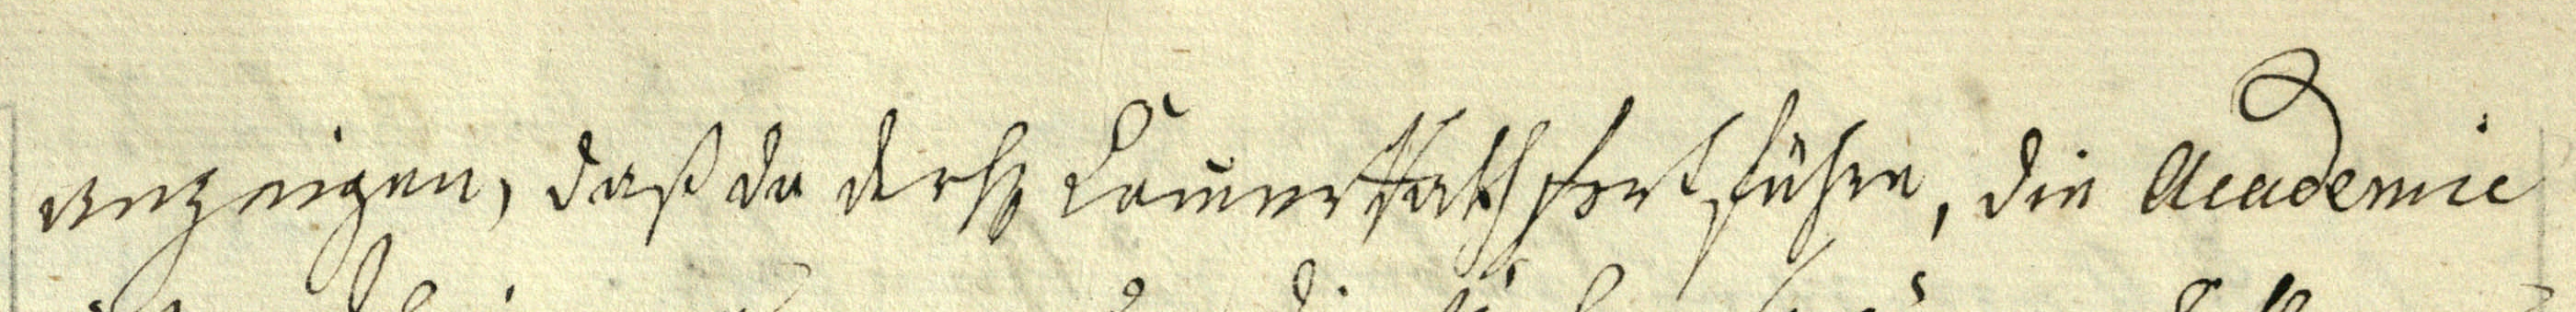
anzeigen, daß da der CamerRath fortführe, die Academie
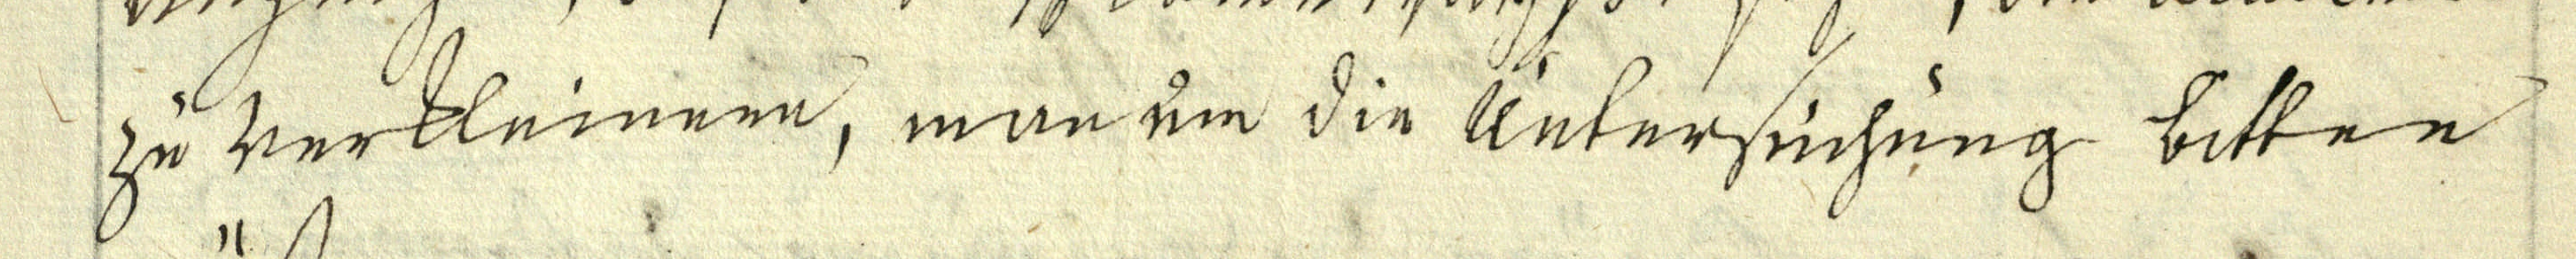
zu verkleinern, man um die Untersuchung bitten
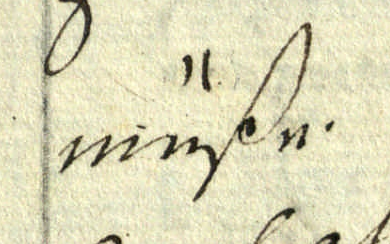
müße.
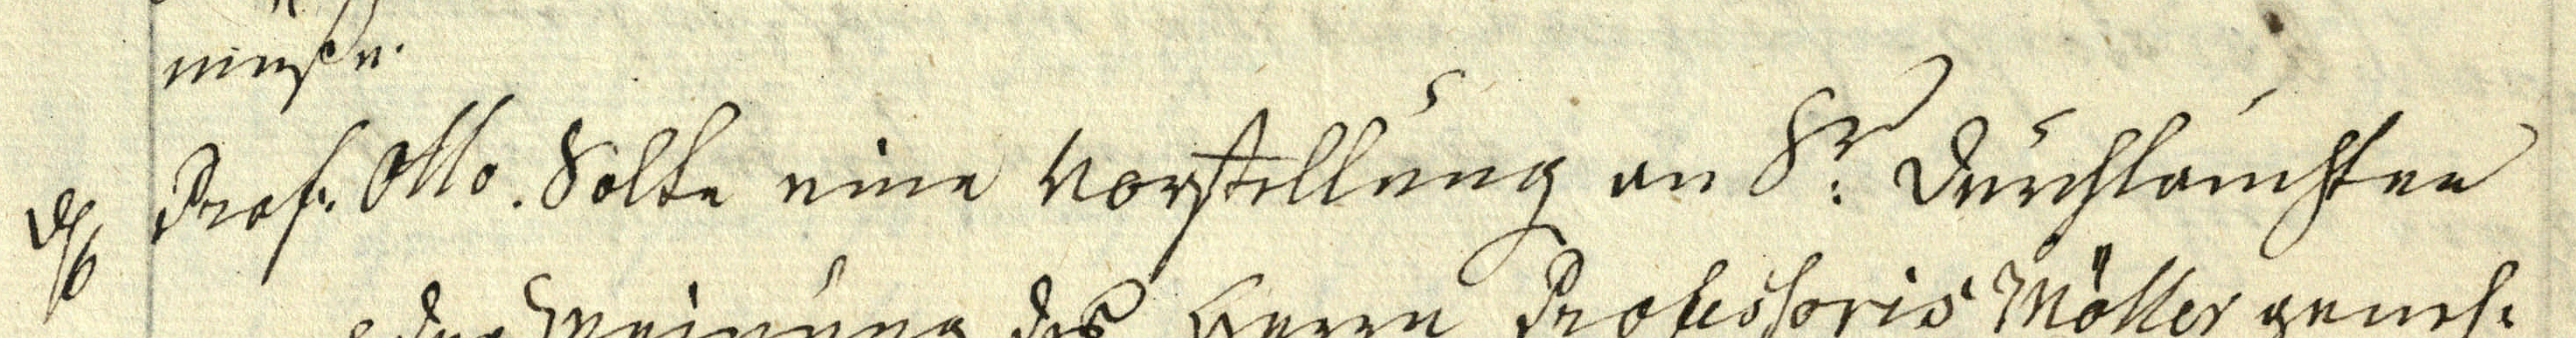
dh Prof. Otto. Solte eine Vorstellung an Sr. Durchlauchten
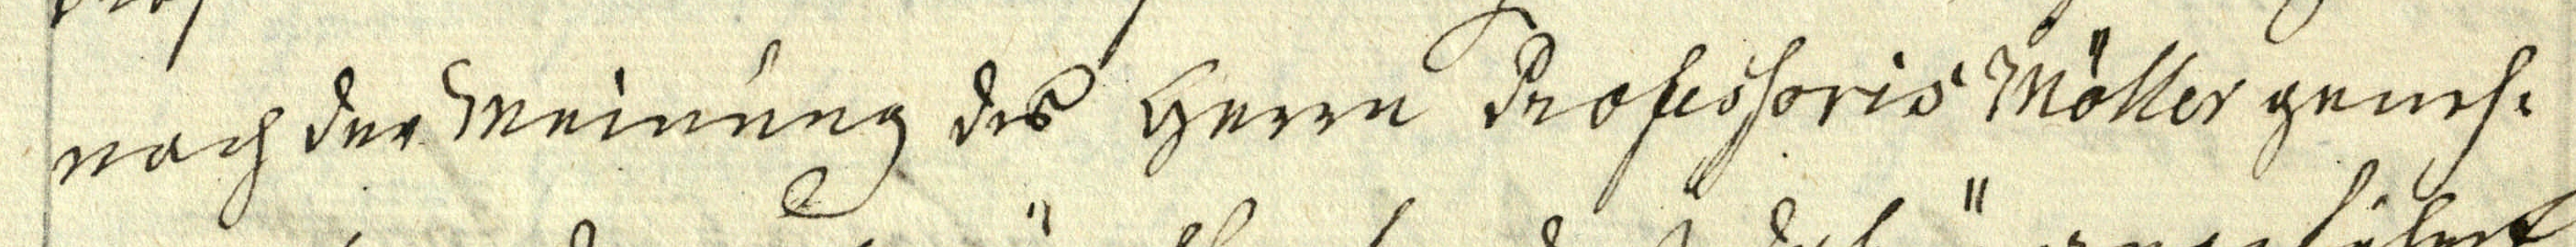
nach der Meinung des Herrn Professoris Möller geneh¬
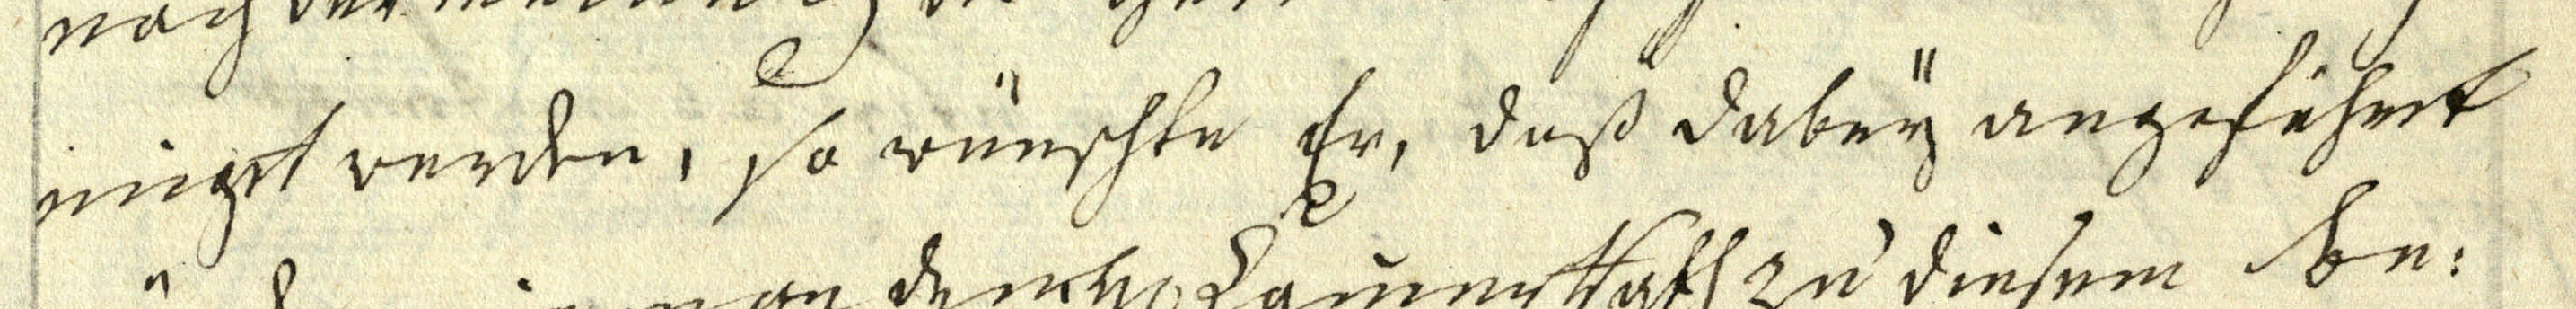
miget werden, so wünschte Er, daß dabeÿ angeführet
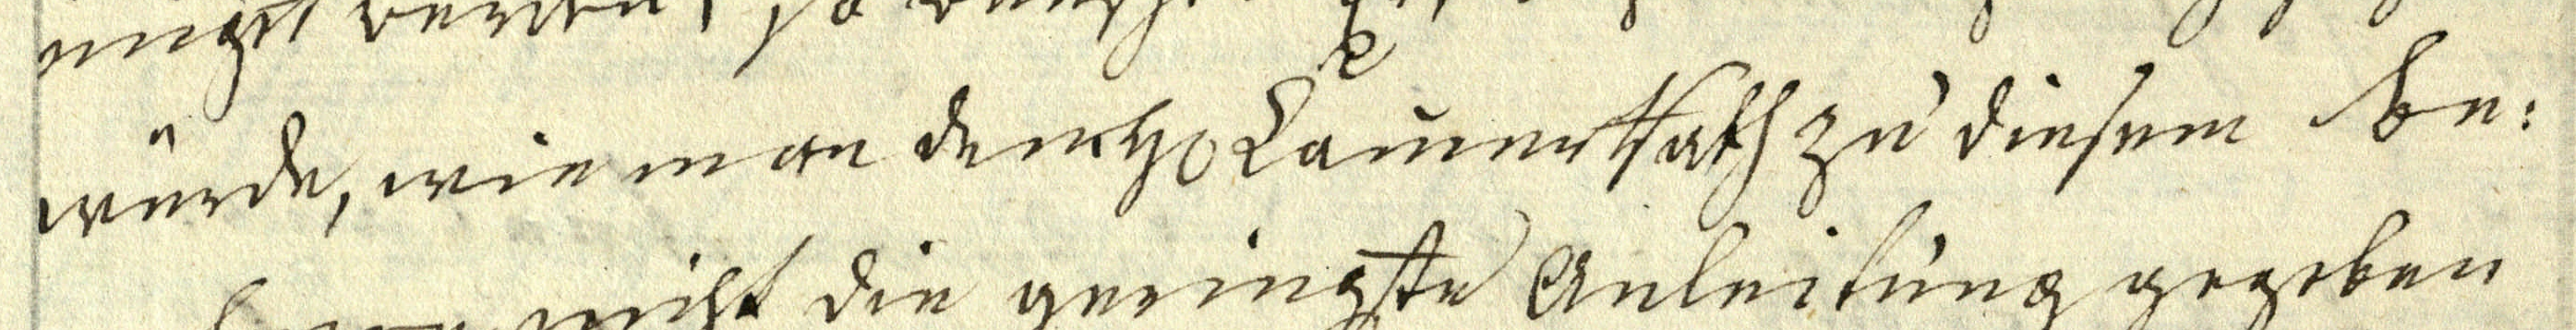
würde, wie man dem H CamerRath zu diesem Be¬
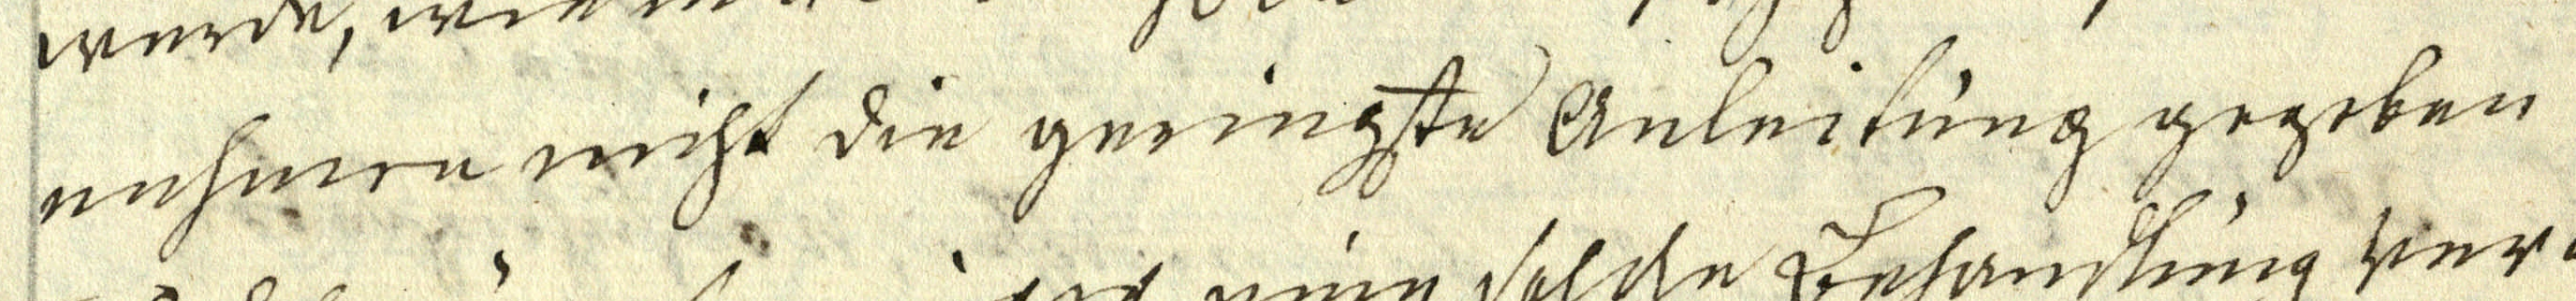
nehmen nicht die geringste Anleitung gegeben
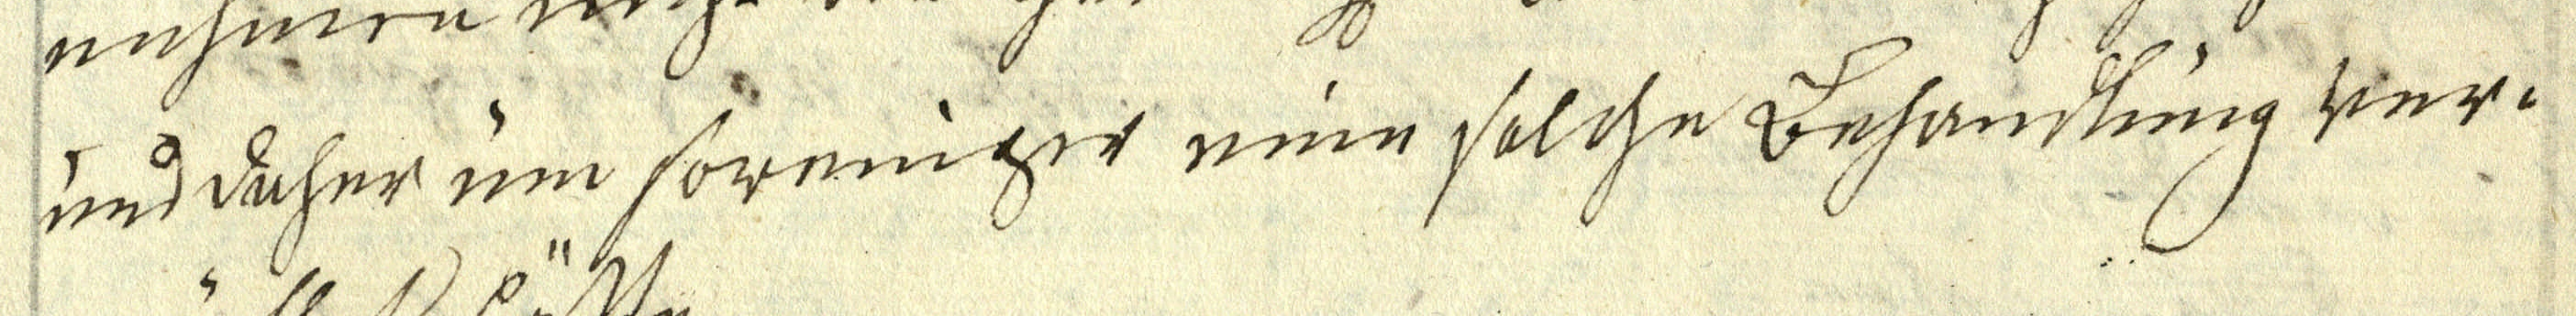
und daher um soweniger eine solche Behandlung ver¬
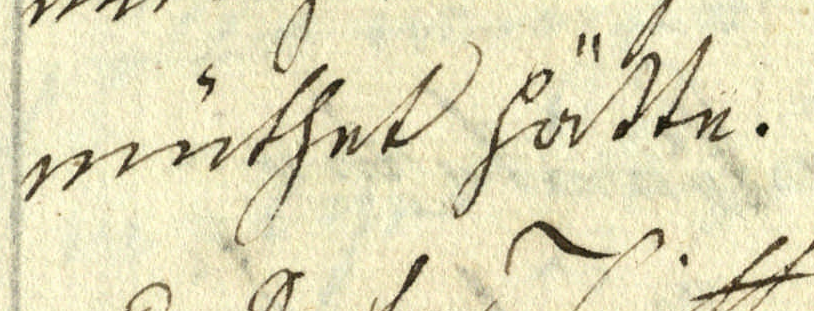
muthet hätte.
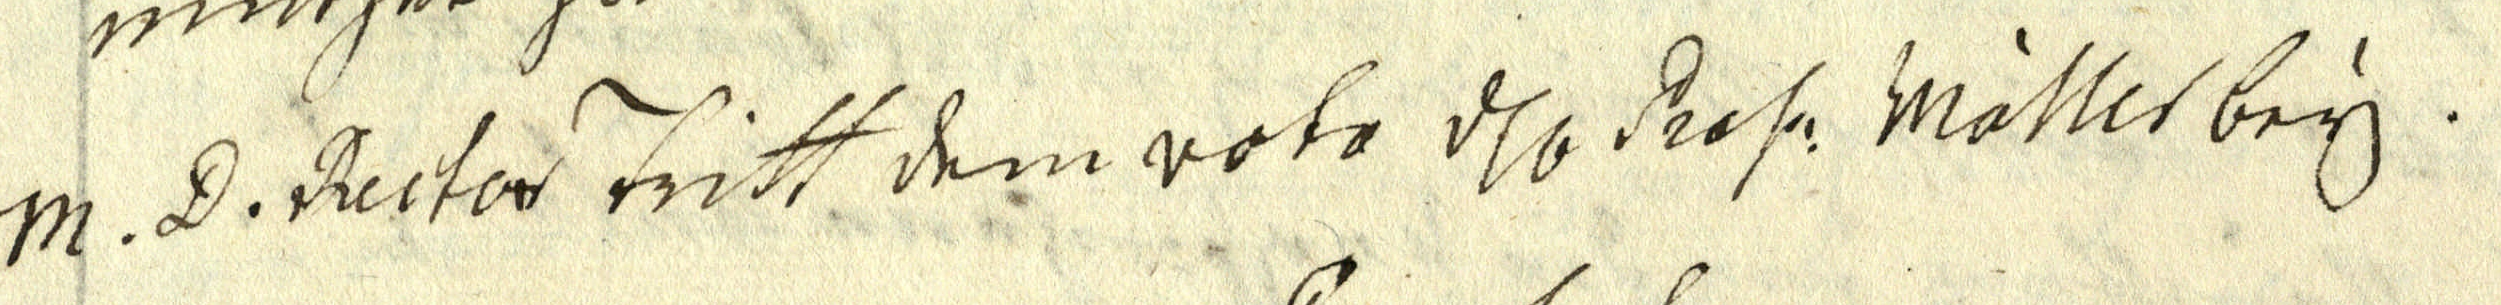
M. D. Rector Tritt dem voto dh Prof. Möller beÿ.
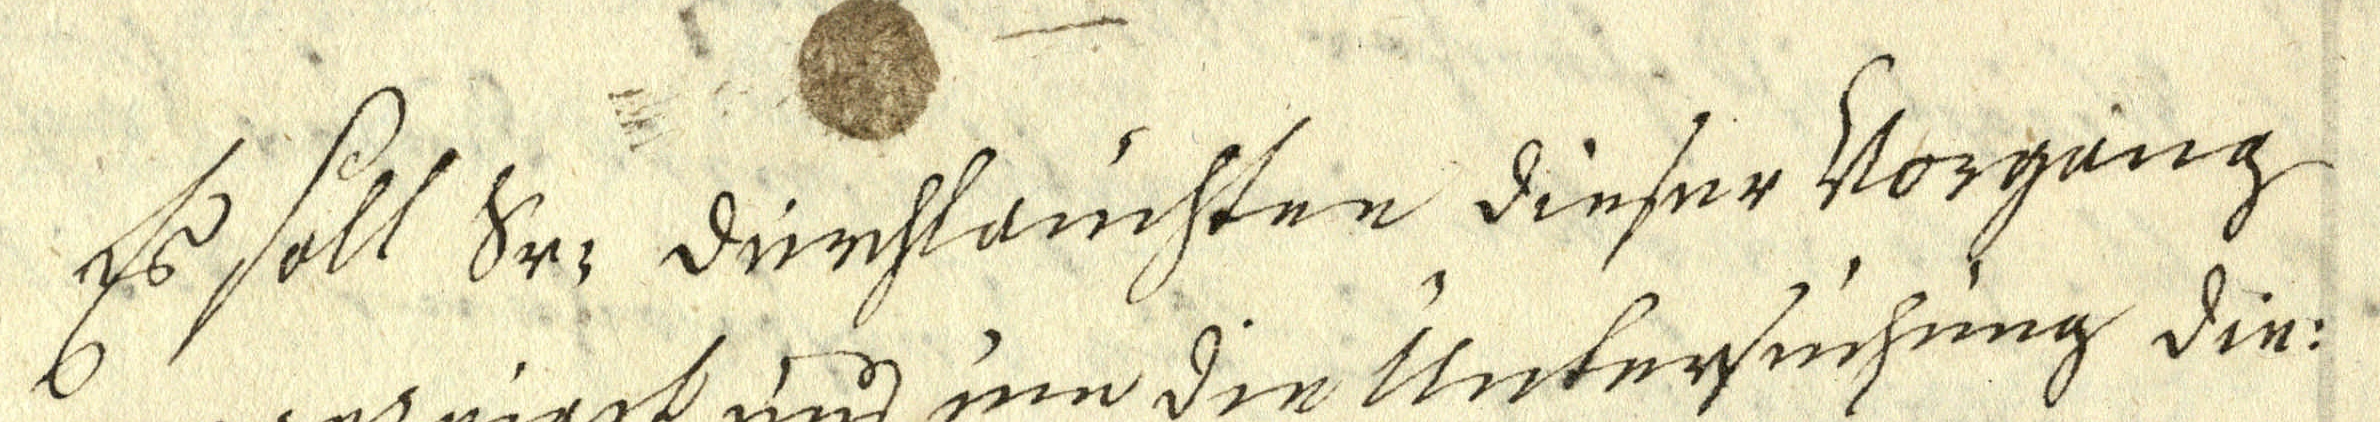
Es soll Sr Durchlauchten dieser Vorgang
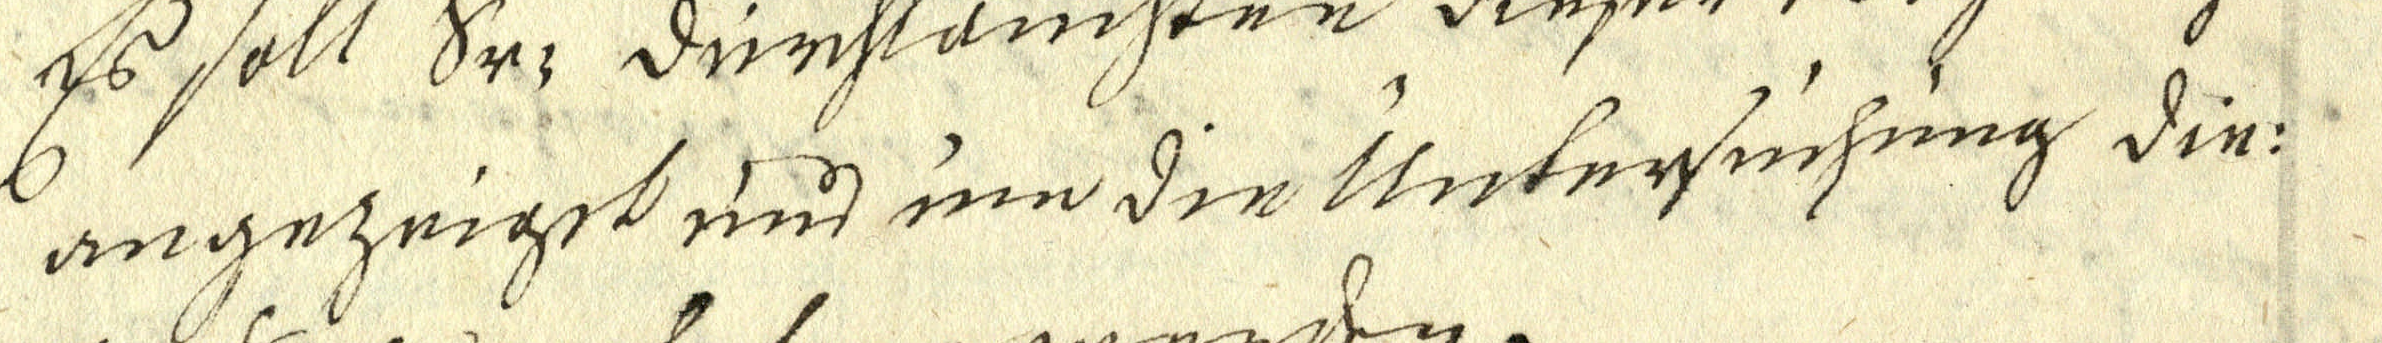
angezeiget und in die Untersuchung die¬
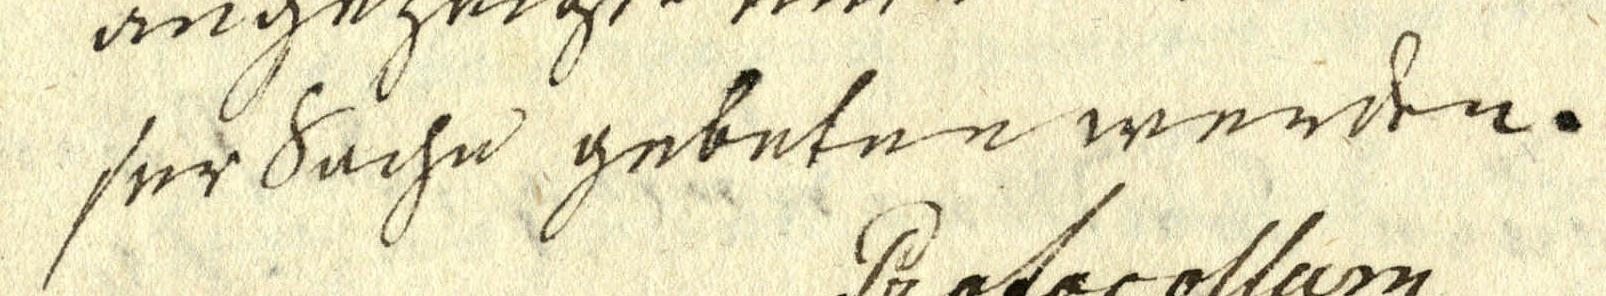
ser Sache gebeten werden.
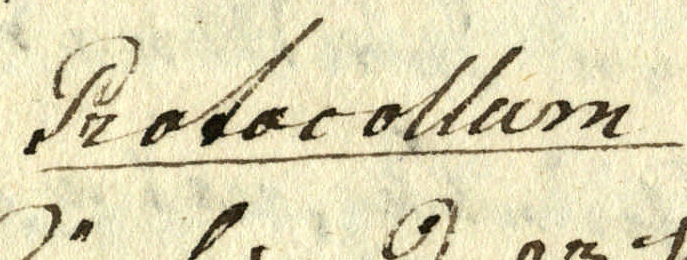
Protocollum
